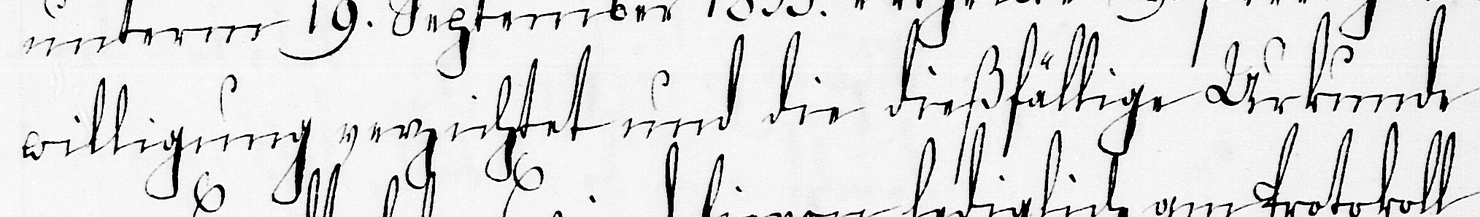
willigung verzichtet und die dießfällige Urkunde
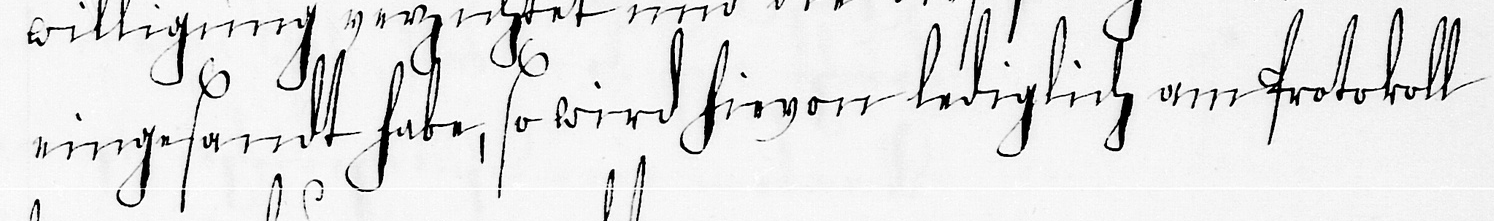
eingesandt habe, so wird hievon lediglich am Protokoll
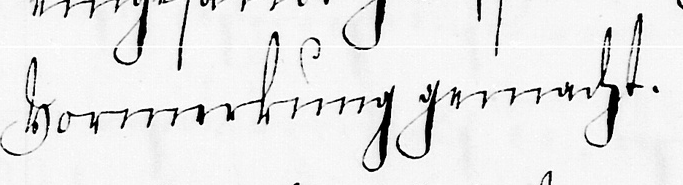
Vormerkung gemacht.
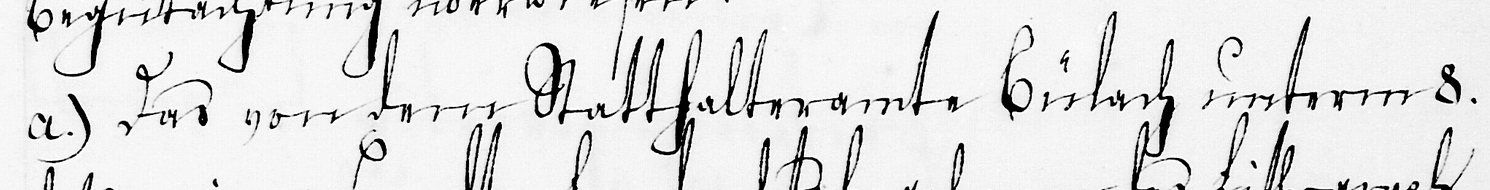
a.) Das von dem Statthalteramte Bülach unterm 8.
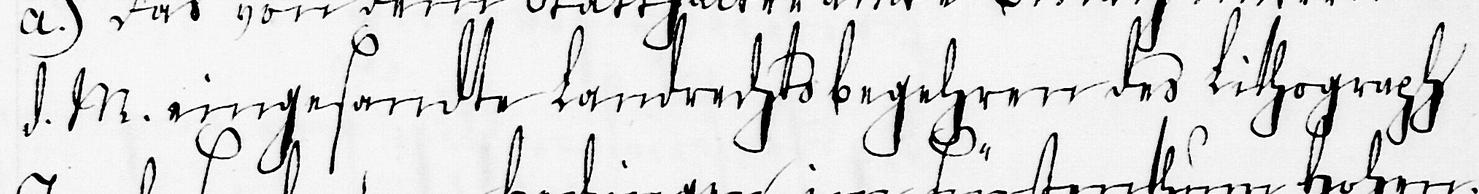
d. M. eingesandte Landrechtsbegehren des Lithograph
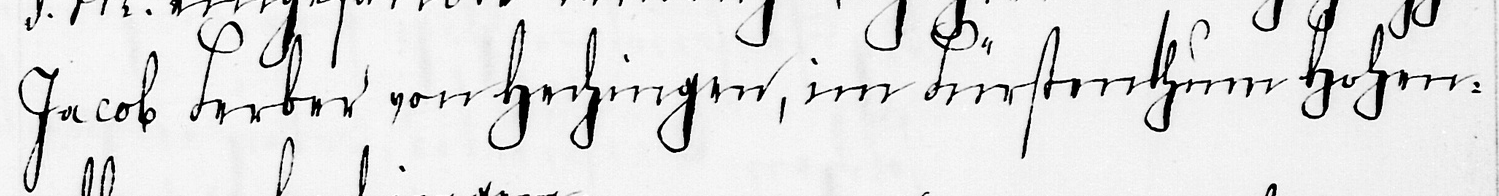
Jacob Ferber von Hechingen, im Fürstenthum Hohen¬
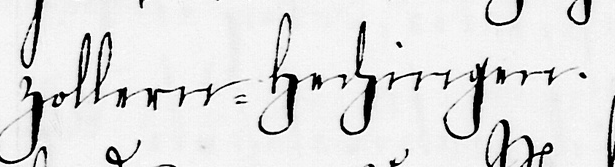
zollern-Hechingen.
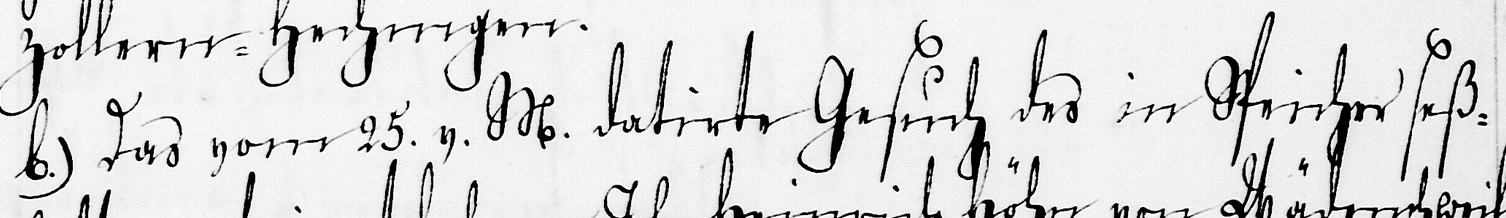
b.) Das vom 25. v. M. datirte Gesuch des im Speicher seß¬
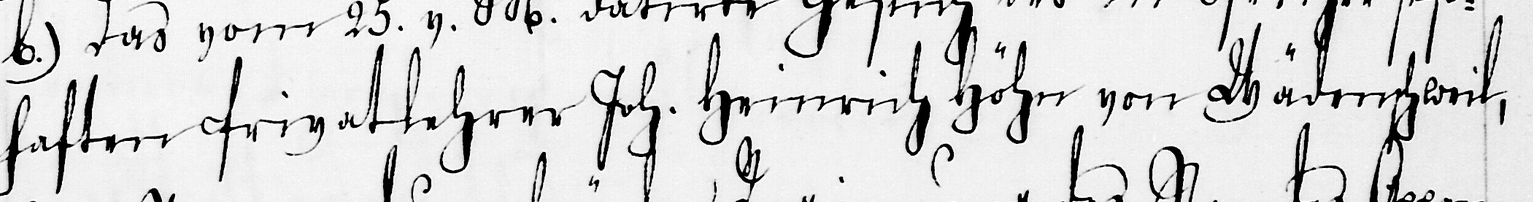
haften Privatlehrer Joh. Heinrich Höhn von Wädenschweil,
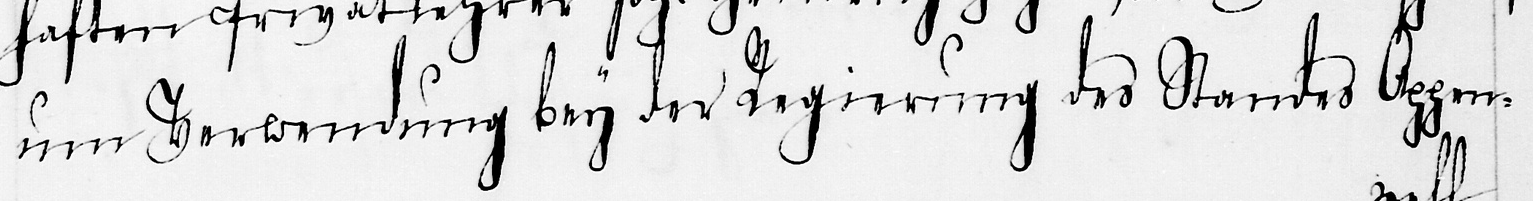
um Verwendung bey der Regierung des Standes Appen-
